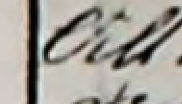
Alt
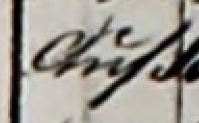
Aus
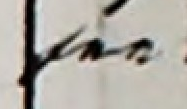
see
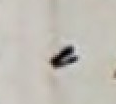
„
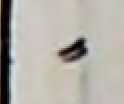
„
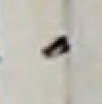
„
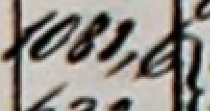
1088,6
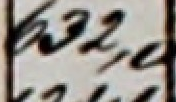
632,0
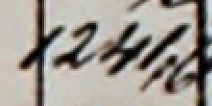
1241,6
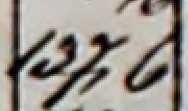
137,6
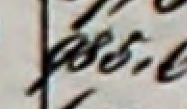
985,6
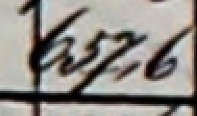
657,6
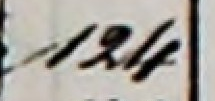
124
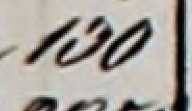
130
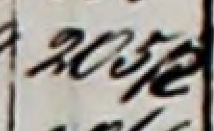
205/?
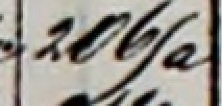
206/a
